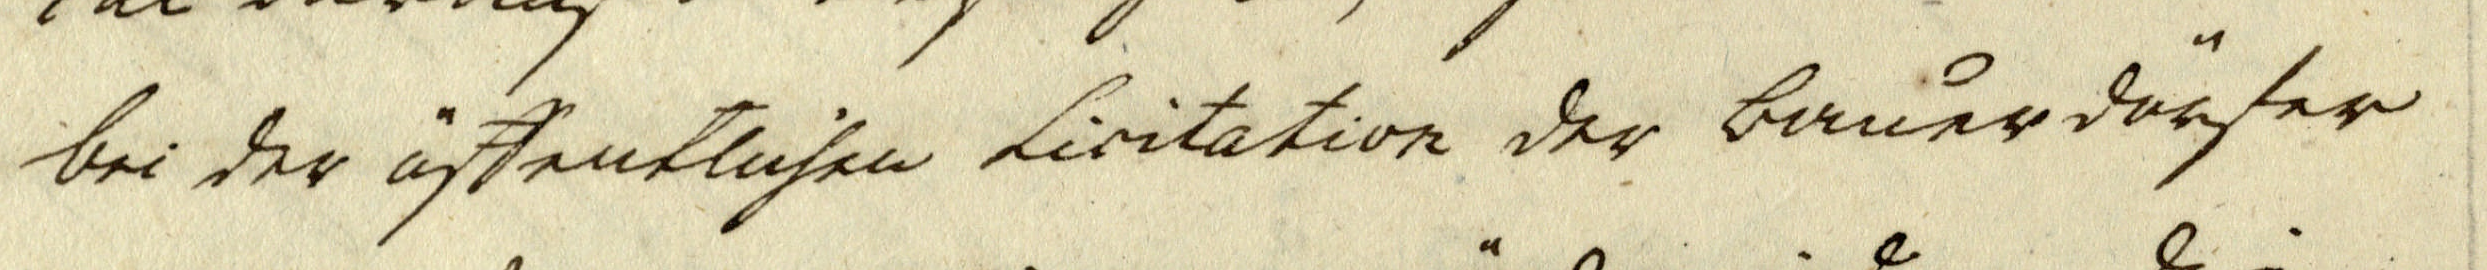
bei der öffentlichen Licitation der Bauerdörfer
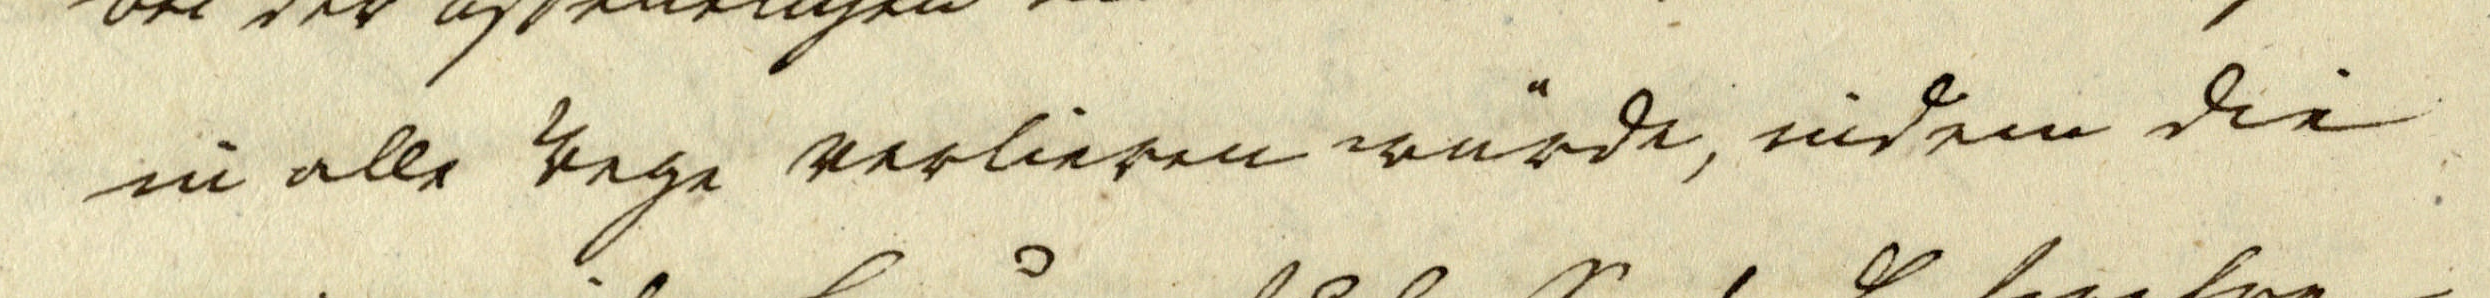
in alle Wege verlieren würde, indem die
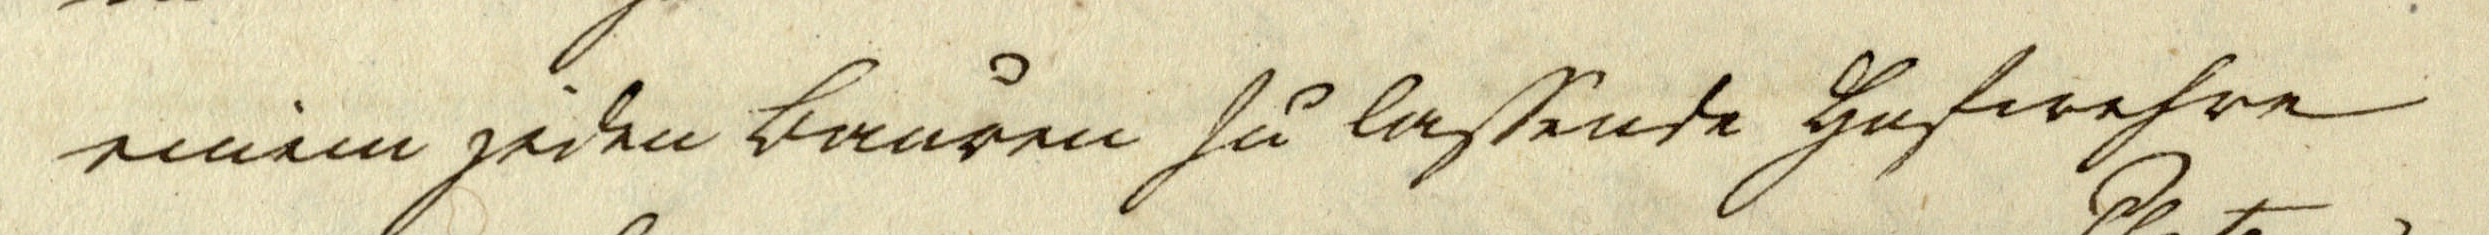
einem den Bauren zu lassende Hofwehre
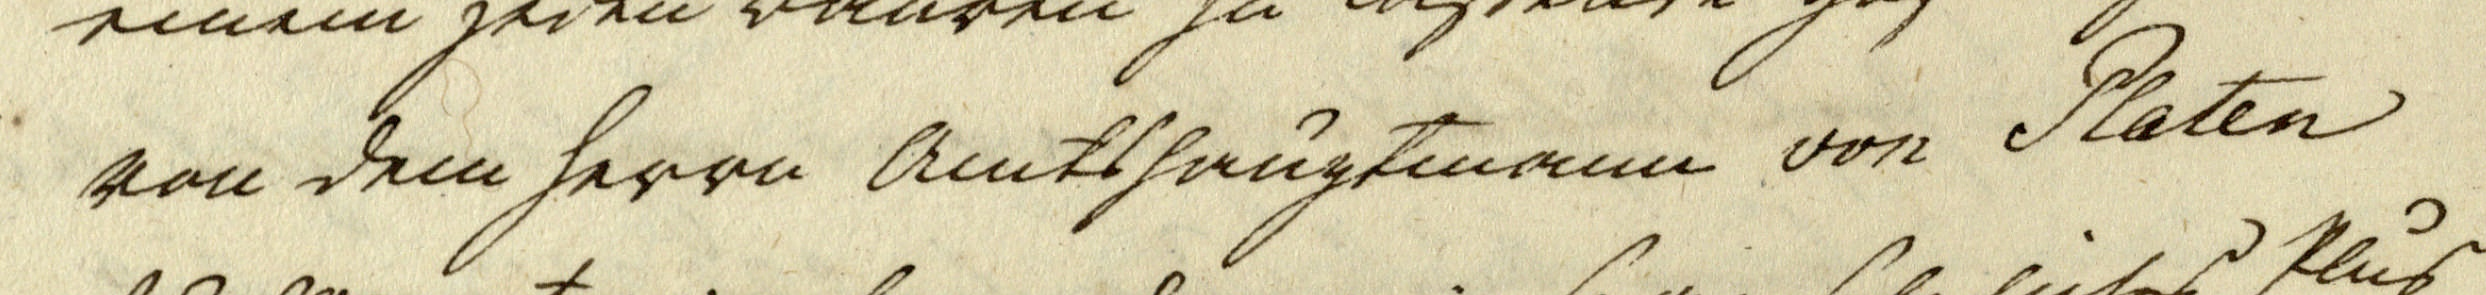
von dem Herrn Amtshauptmann von Platen
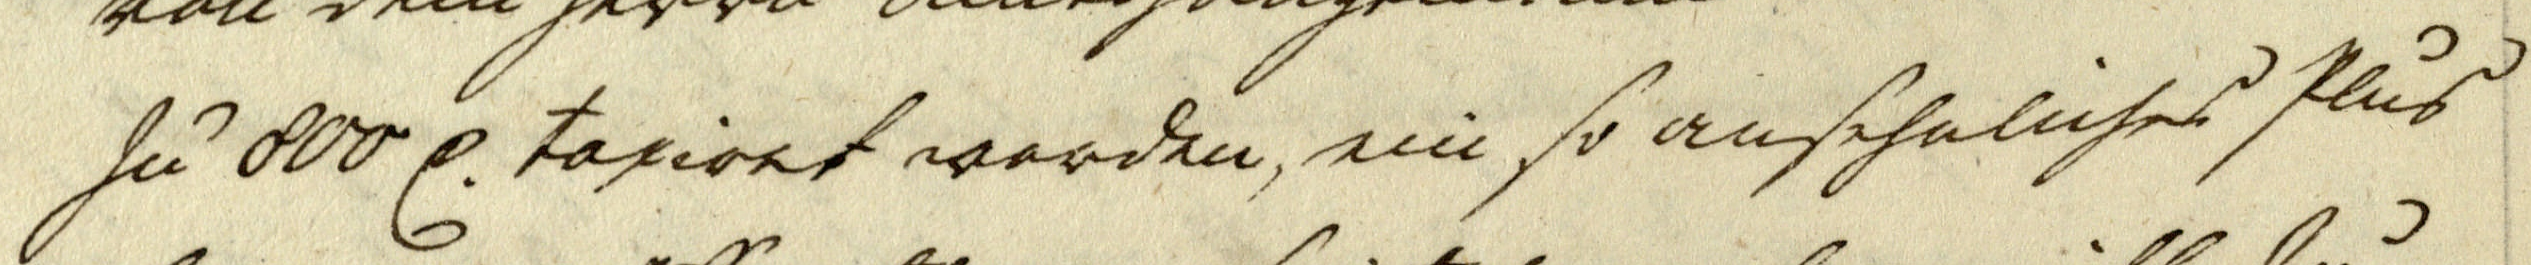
zu 800 l. taxiret worden, ein so ansehnliches Plus
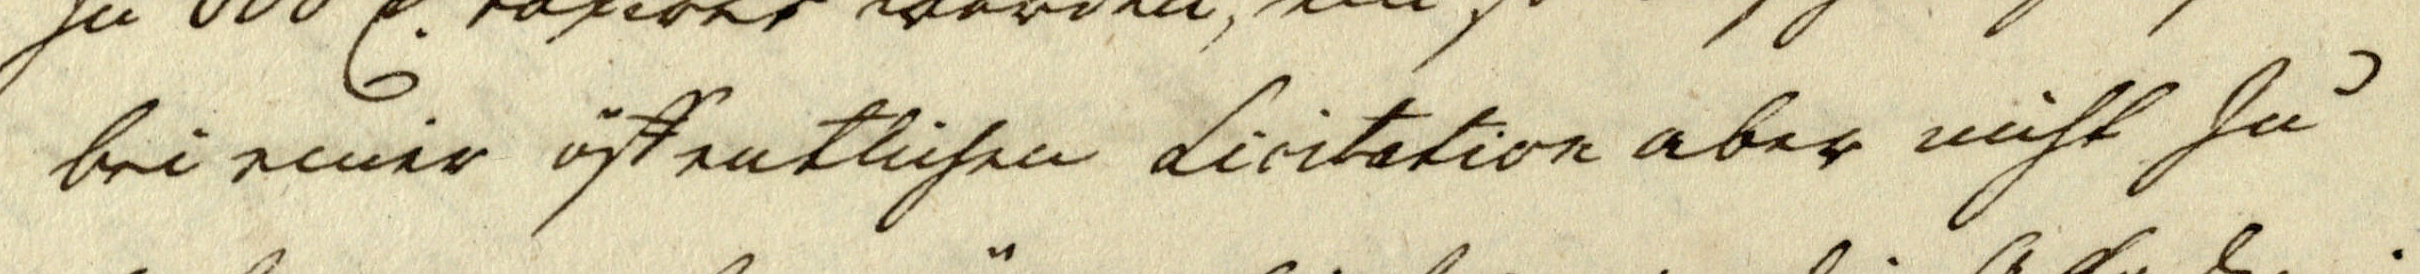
bei einer öffentlichen Licitation aber nicht zu
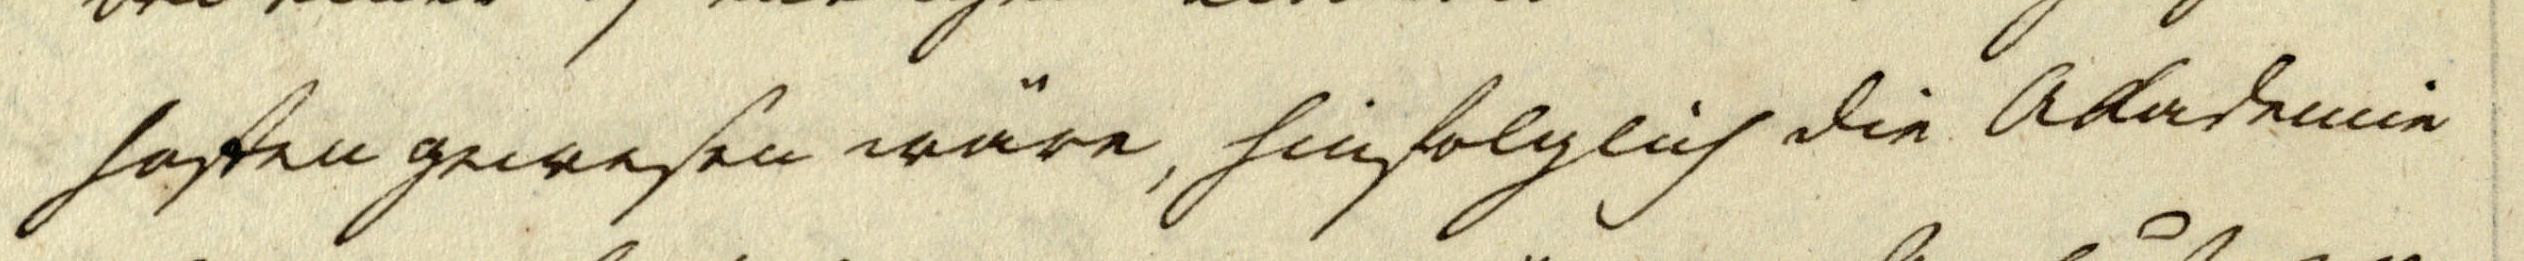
hoffen gewesen wäre, hinfolglich die Akademie
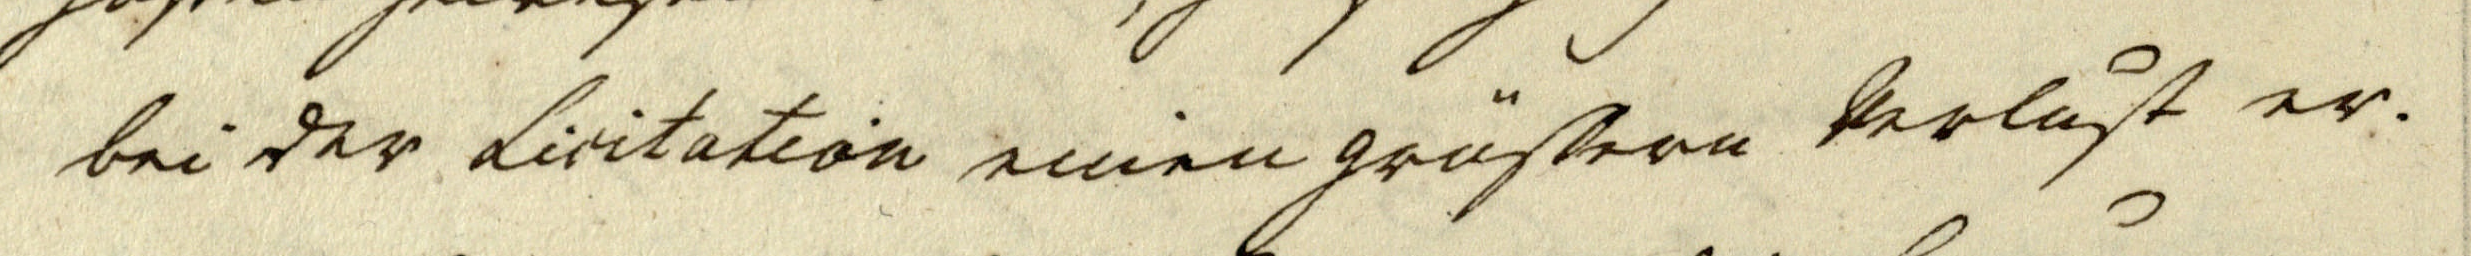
bei der Licitation einen größern Verlust er¬
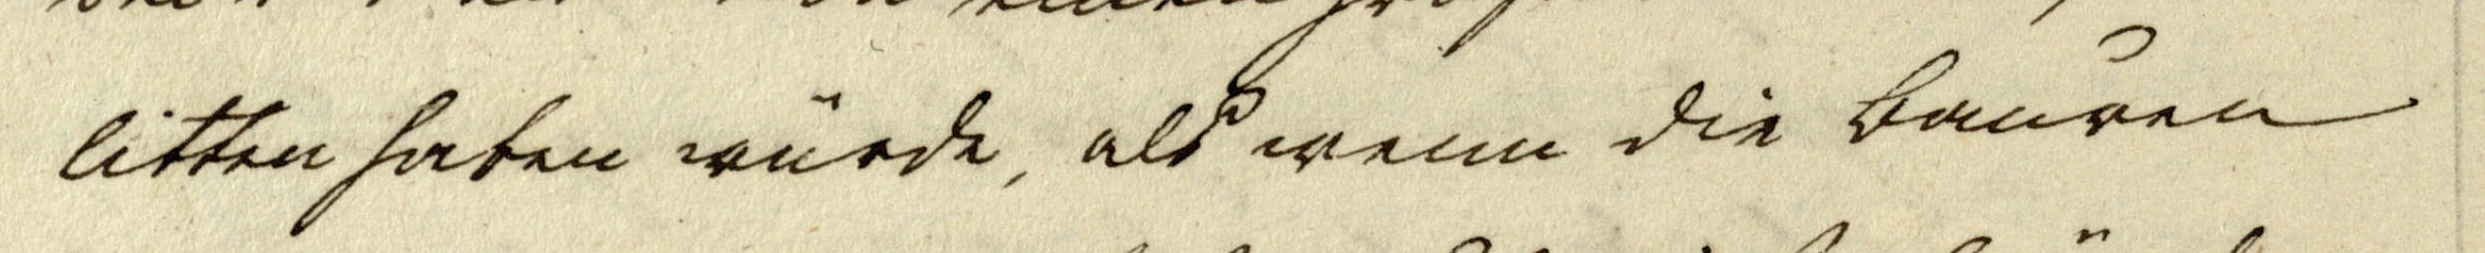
litten haben würde, als wenn die Bauren
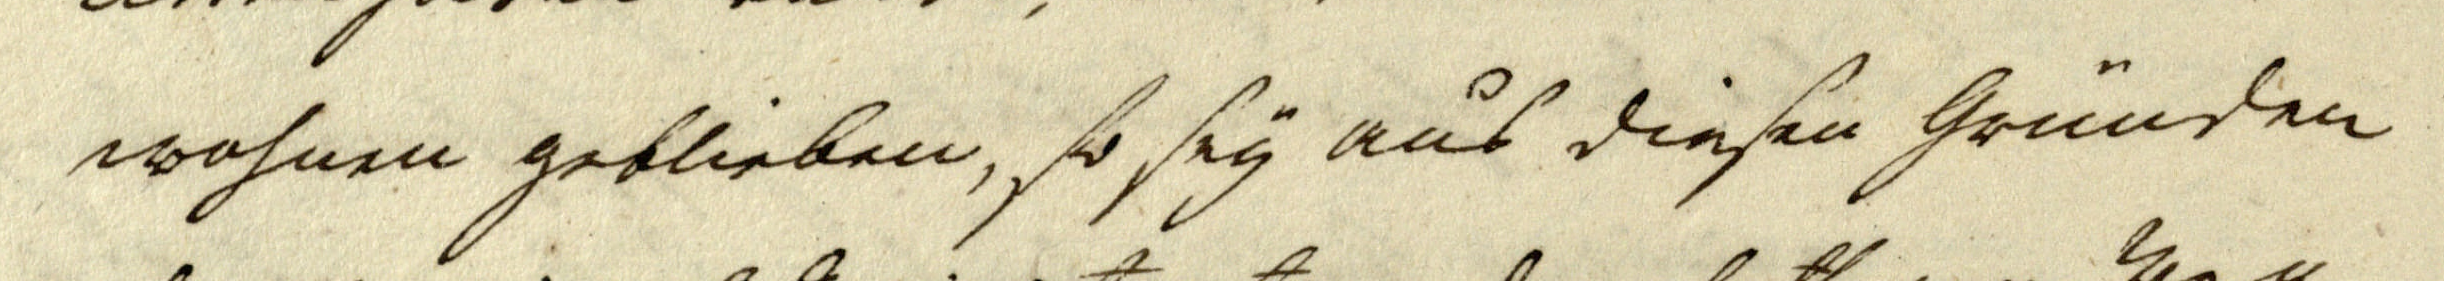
wohnen geblieben, so seÿ aus diesen Gründen
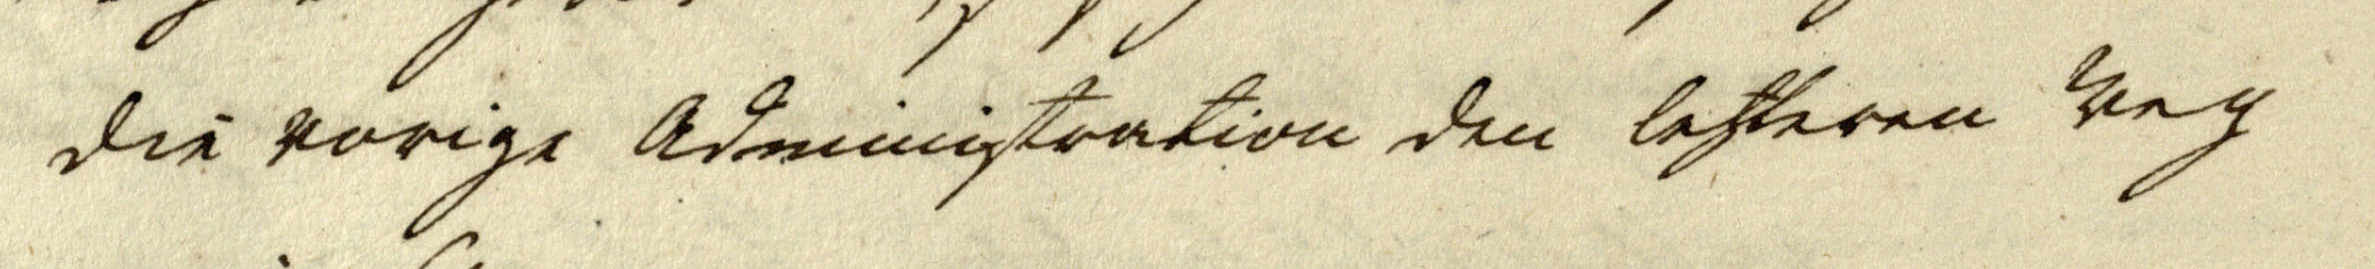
die vorige Administration den letzteren Weg
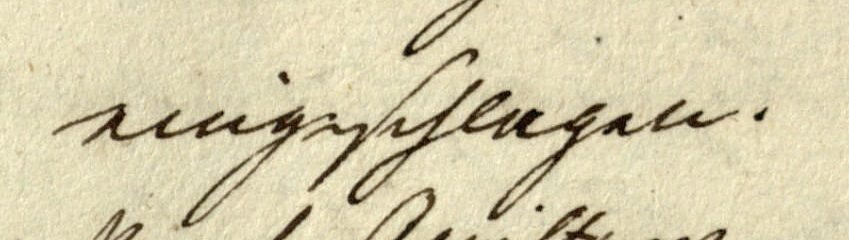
eingeschlagen.
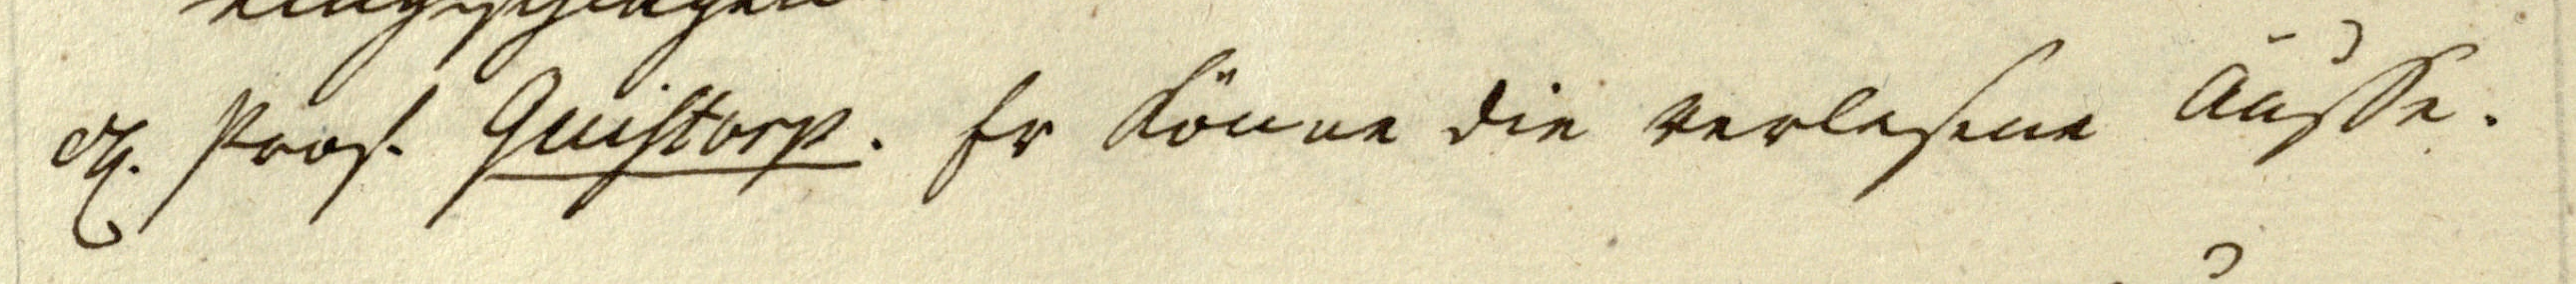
dh. Prof. Quistorp. Er könne die verlesene Äusse¬
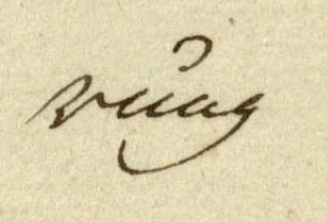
rung
